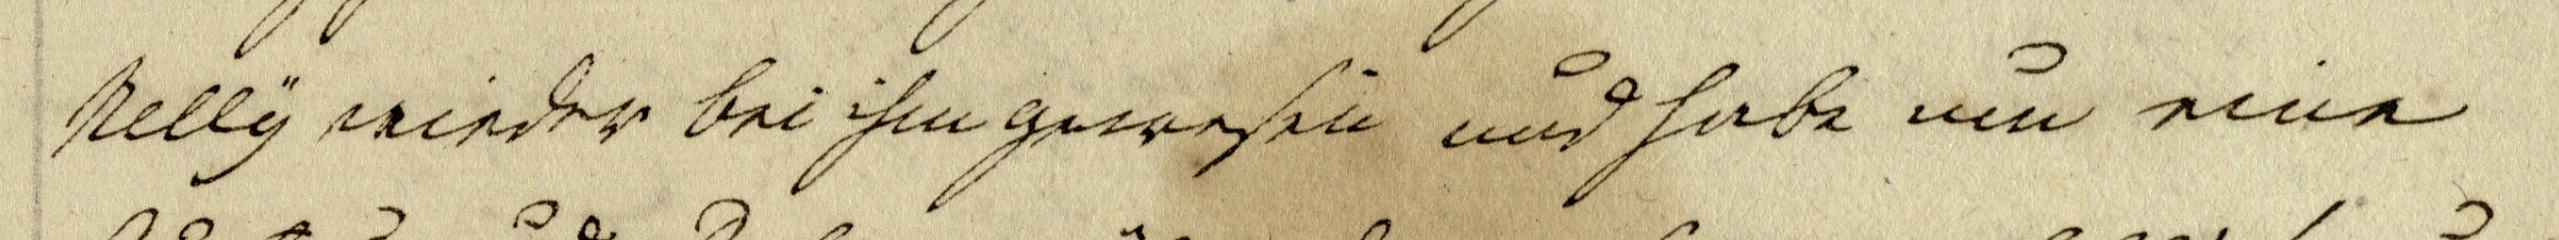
Nellÿ wieder bei ihm gewesen und habe um eine
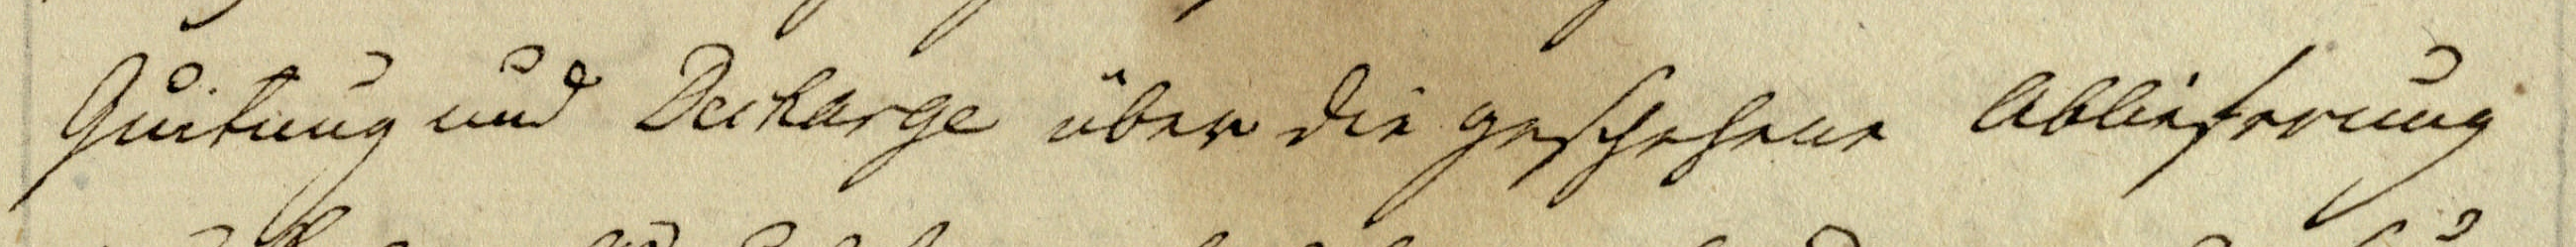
Quitung und Decharge über die geschehene Ablieferung
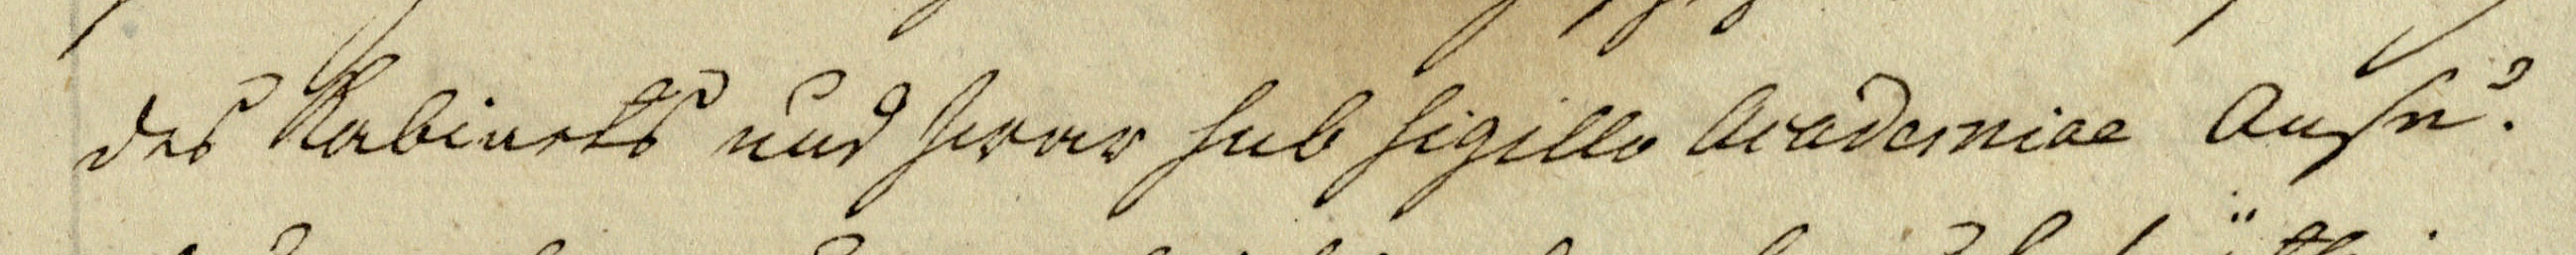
des Kakinets und zwar sub sigillo Academiae Ansu¬
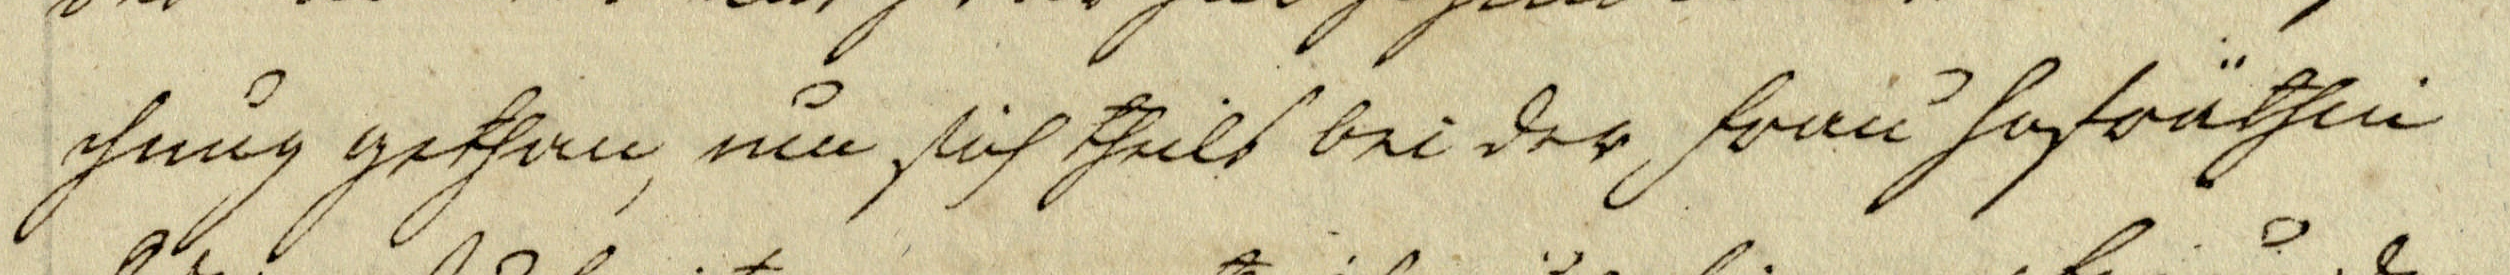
chung gethan, um sich theils bei der Frau Hofräthin
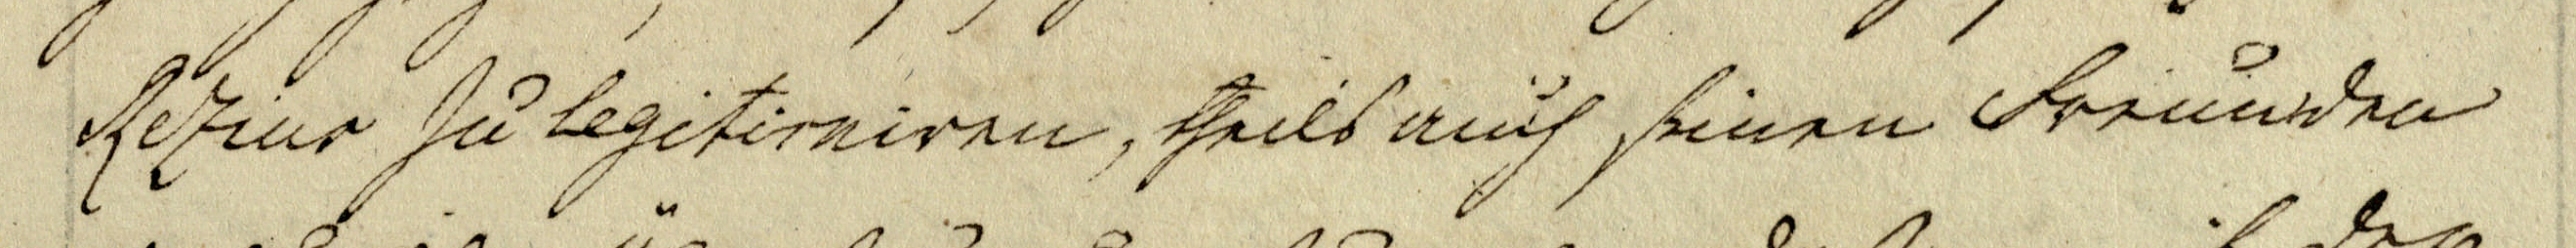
Rezius zu legitimiren, theils auch seinen Freunden
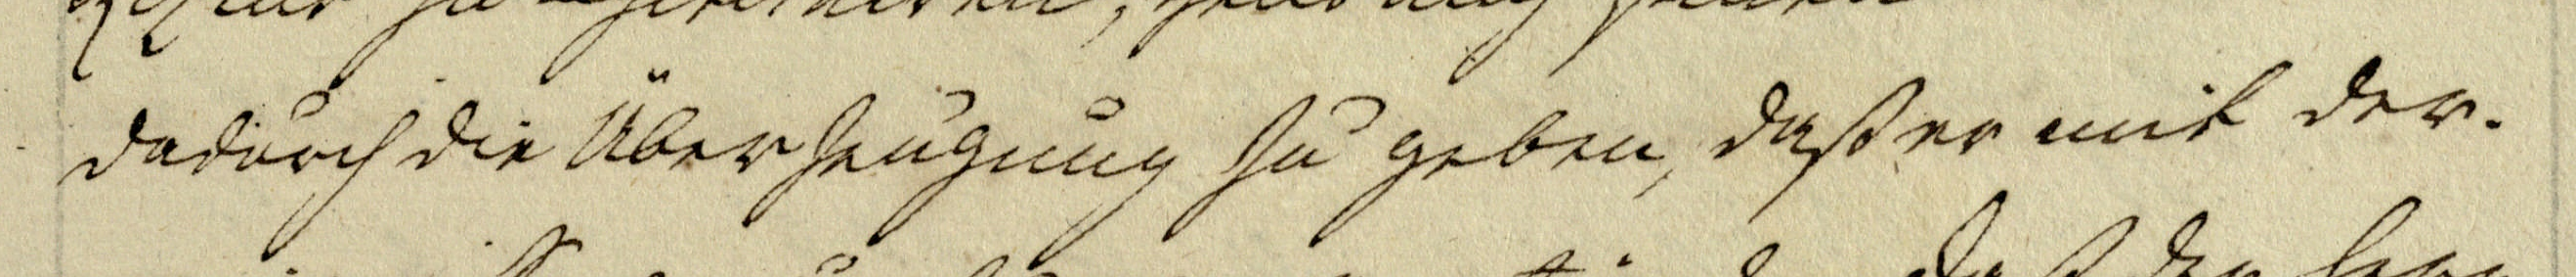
dadurch die Überzeugung zu geben, daß er mit der¬
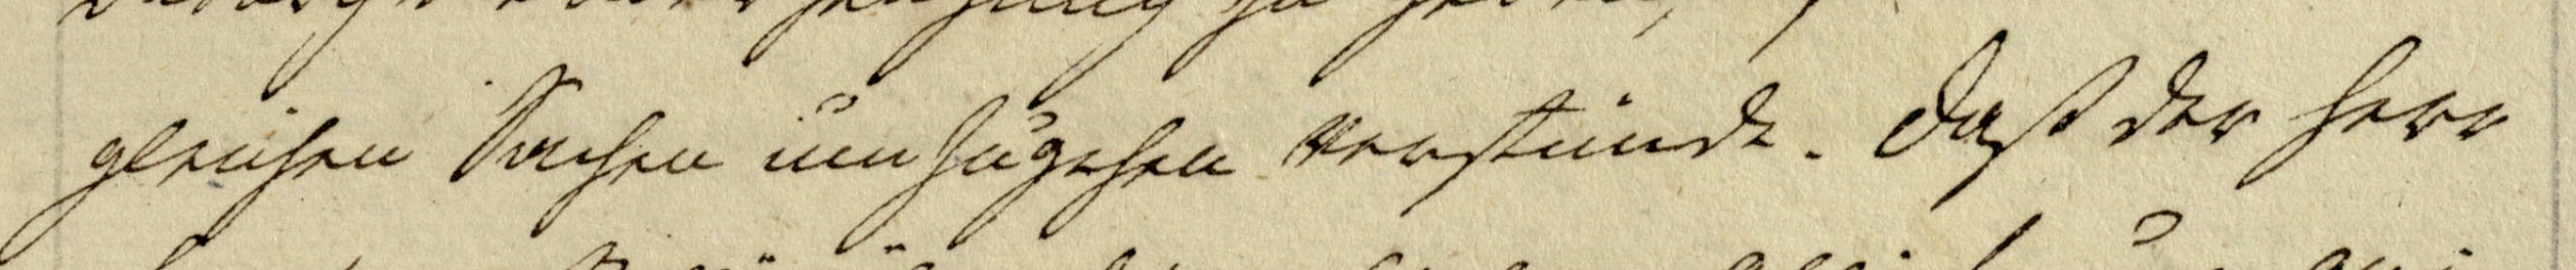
gleichen Sachen um zugehen verstünde. Daß der Herr
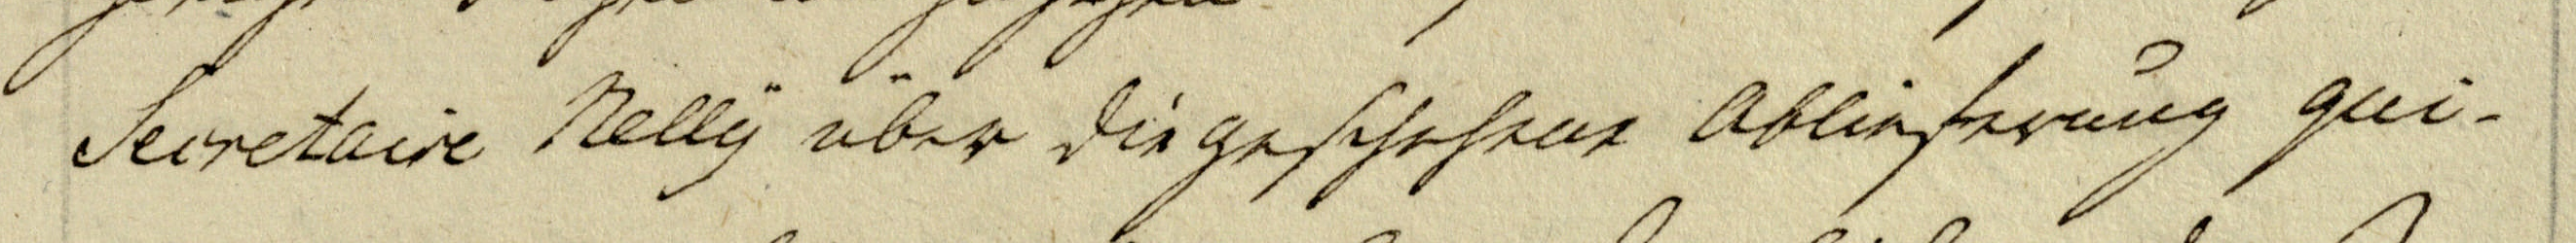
Secretaire Nellÿ über die geschehene Ablieferung qui¬
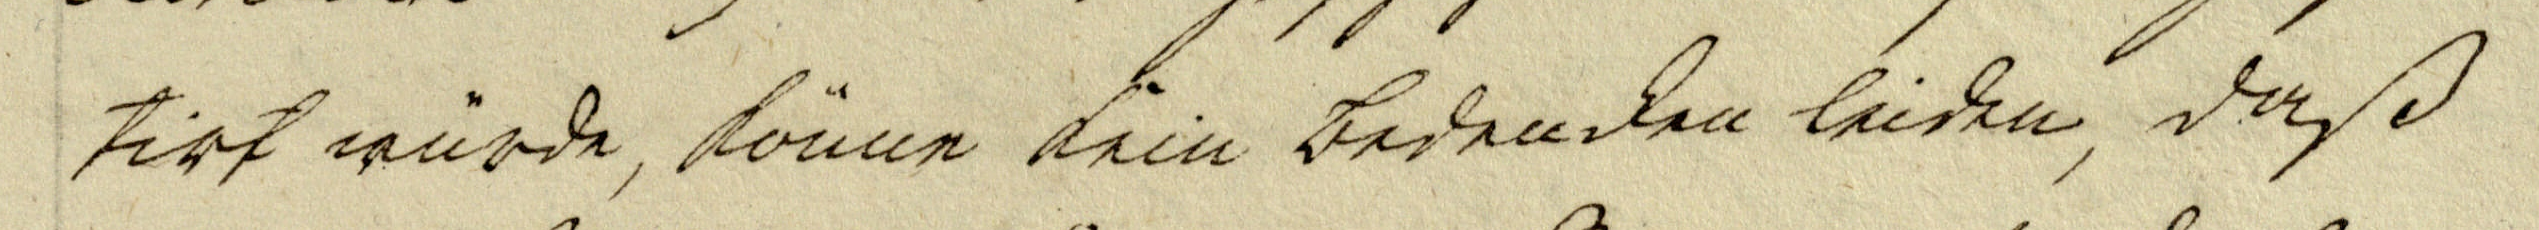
tirt würde, könne kein Bedencken leiden, daß
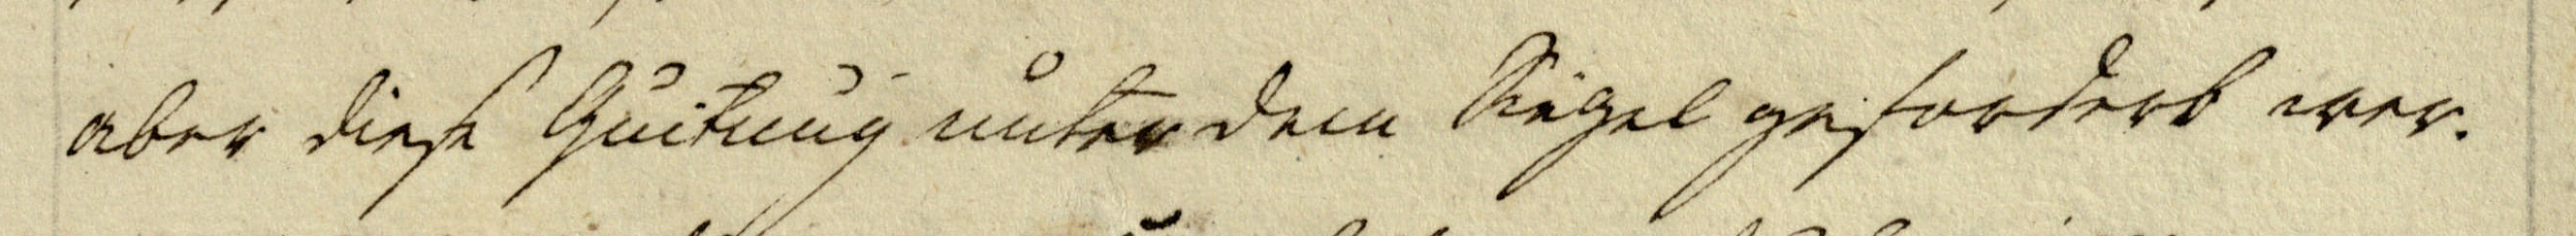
aber diese Quitung unter dem Siegel gefordert wer¬
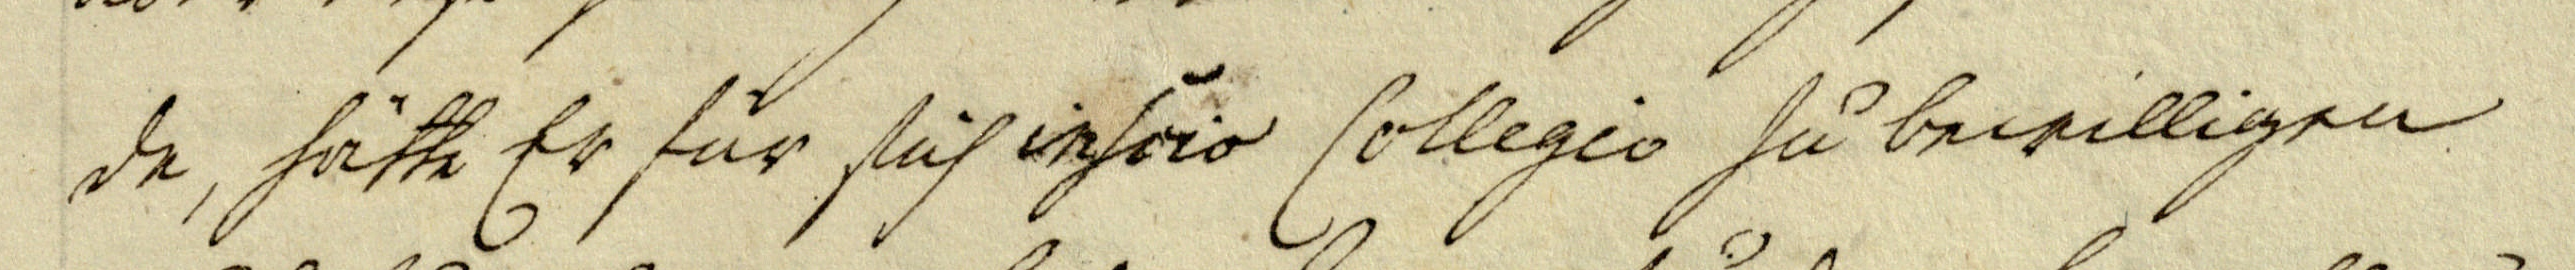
de, hätte Er für sich inscio Collegio zu bewilligen
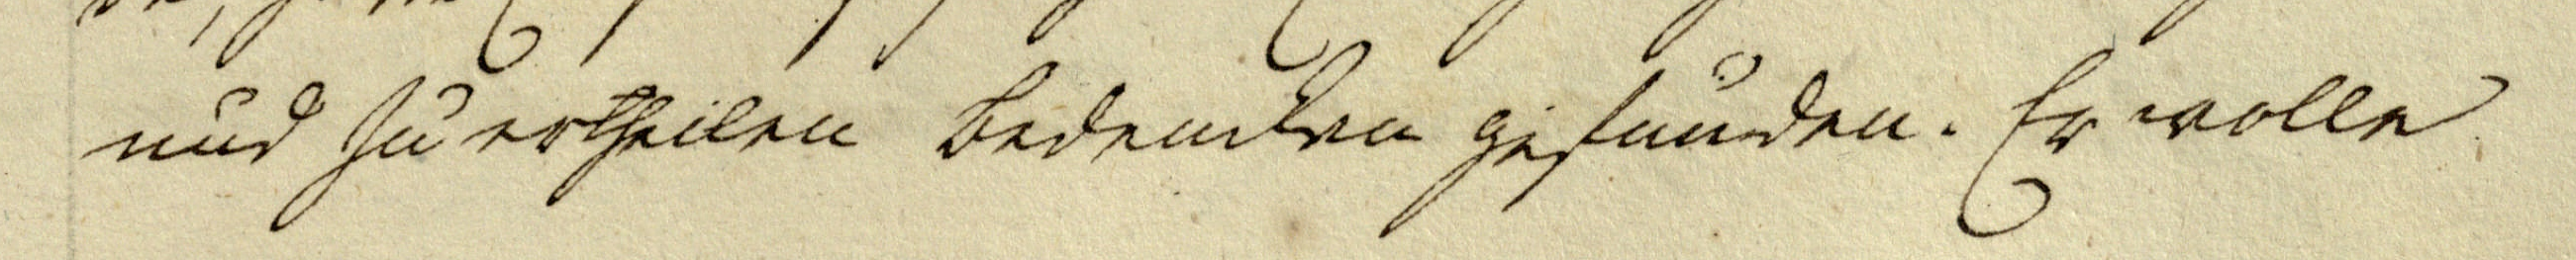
und zu ertheilen Bedencken gefunden. Er wolle
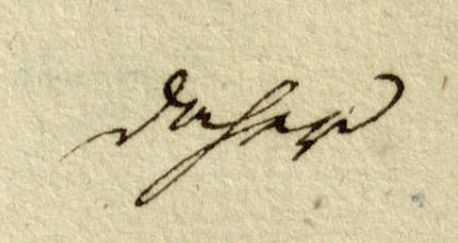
daher
